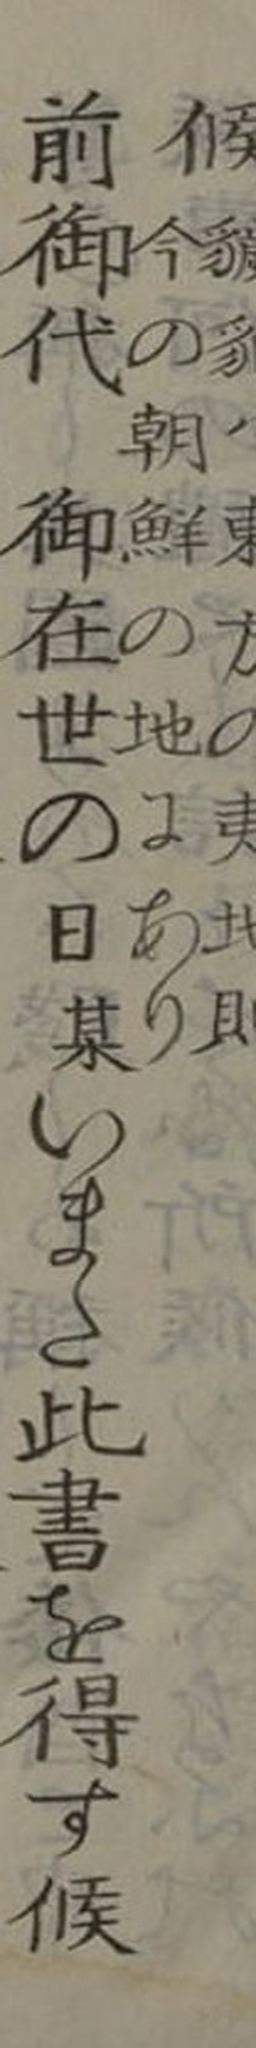前御代御在世の日某いまた此書を得す候
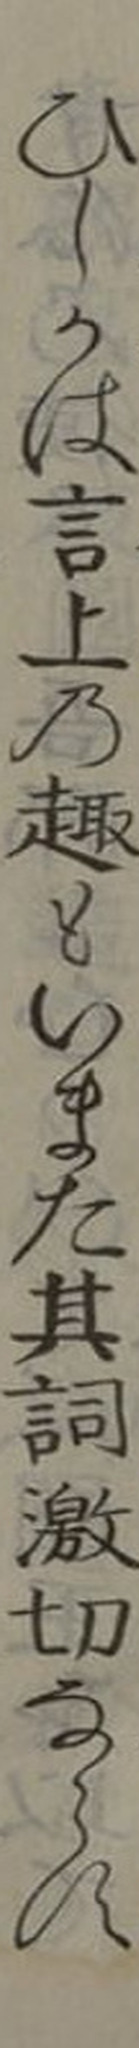ひしかは言上の趣もいまた其詞激切ならす
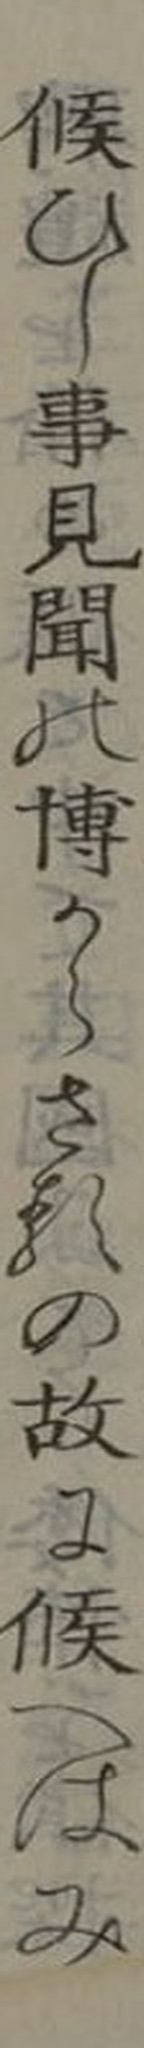候ひし事見聞の博からさるの故に候へはみ
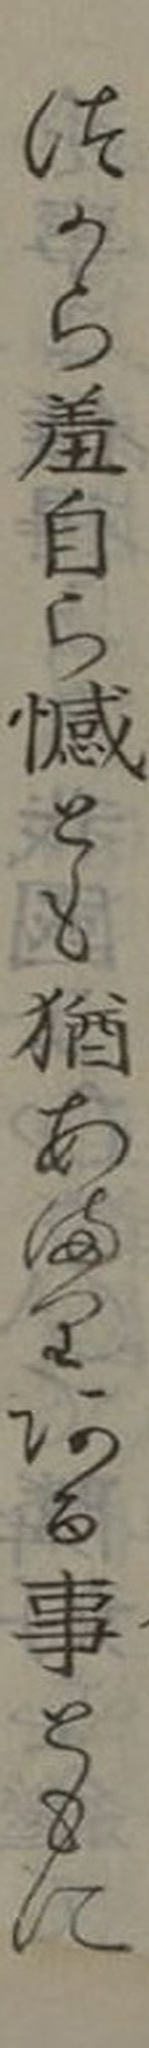つから羞自ら憾とも猶あまりある事ともに
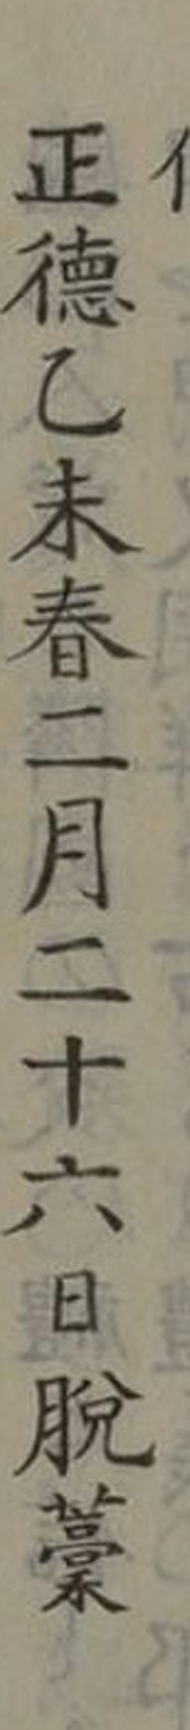正德乙未春二月二十六日脫藁
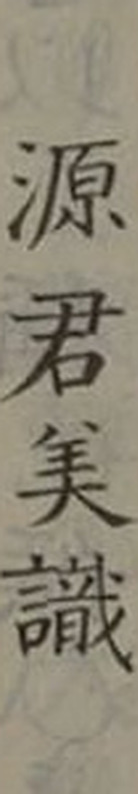源君美識
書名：骨董録
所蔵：University of the Ryukyus Library
